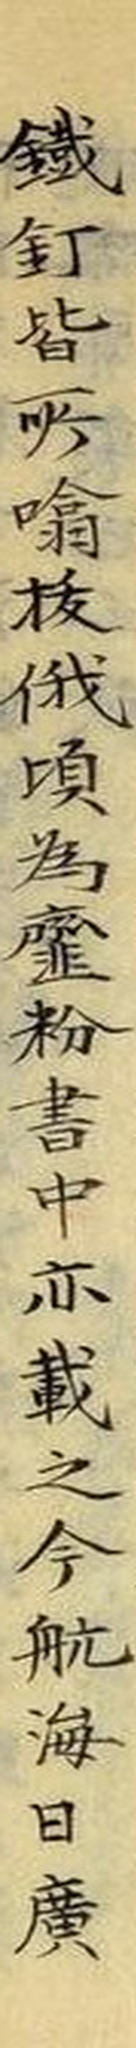鉄釘皆所噏抜俄頃為虀紛書中亦載之今航海日広
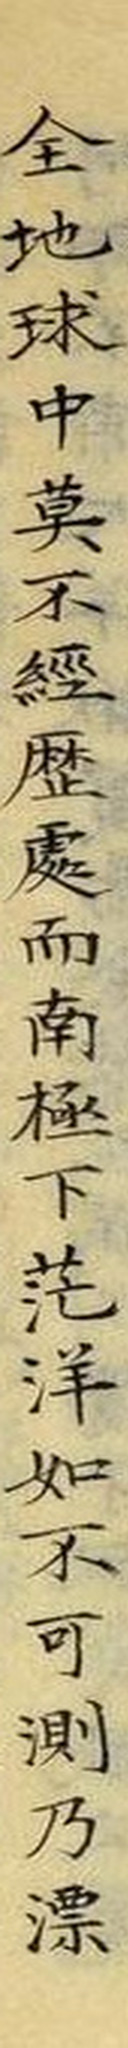全地球中莫不経歴處而南極下茫洋如不可側乃漂
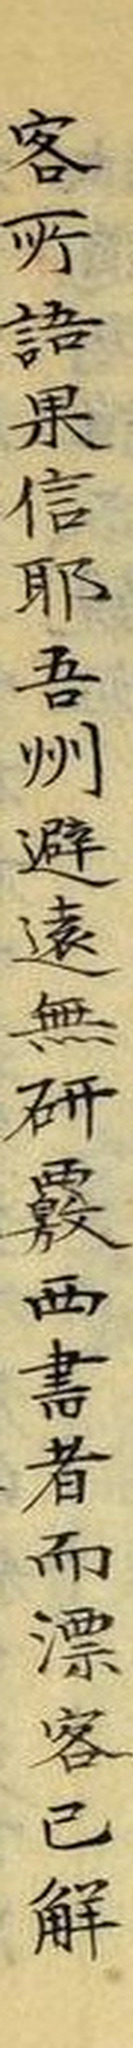客所語果信耶吾州避遠無研覈西書者而漂客已解
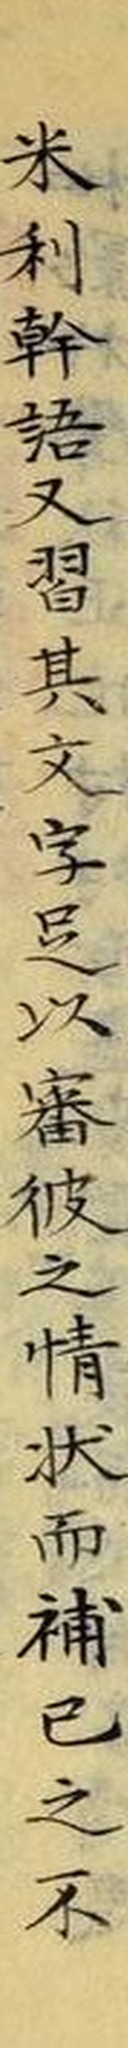米利幹語又習其文足以審彼之情状而補已之不

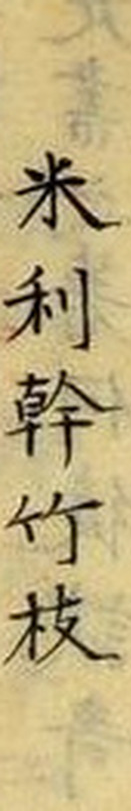米利幹竹枝
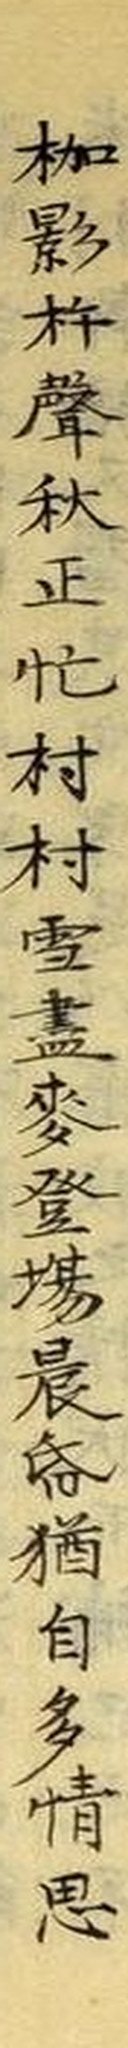伽影杵声秋正忙村村雪尽麦登場晨紙猶自多情思
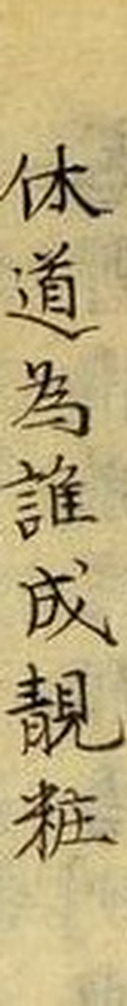休道為誰成靚粧
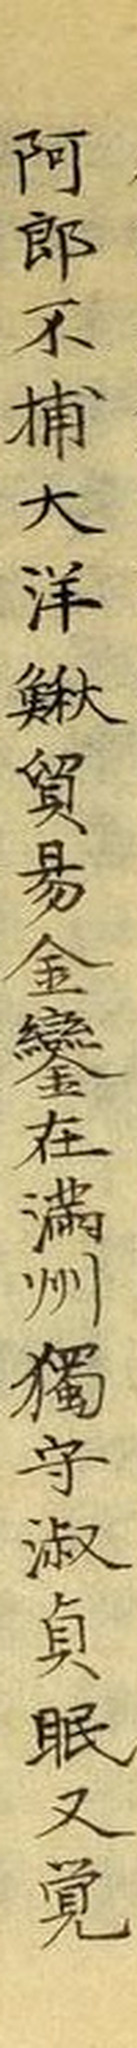阿郎不捕大洋鰍貿易金鑾在満州独守淑貞眠又覚
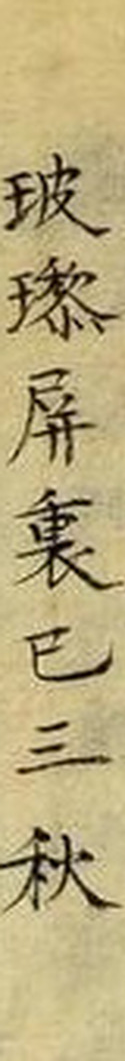玻瓈屏裏巳三秋
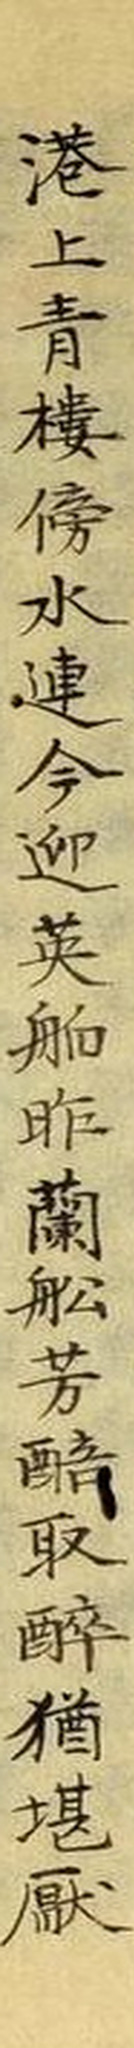港上青楼傍水連今迎英舮昨蘭船芳醅取酔猶堪厭
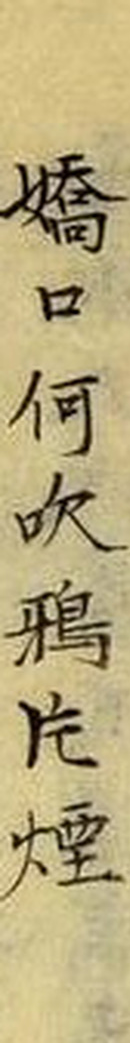嬌口何吹鴉片煙
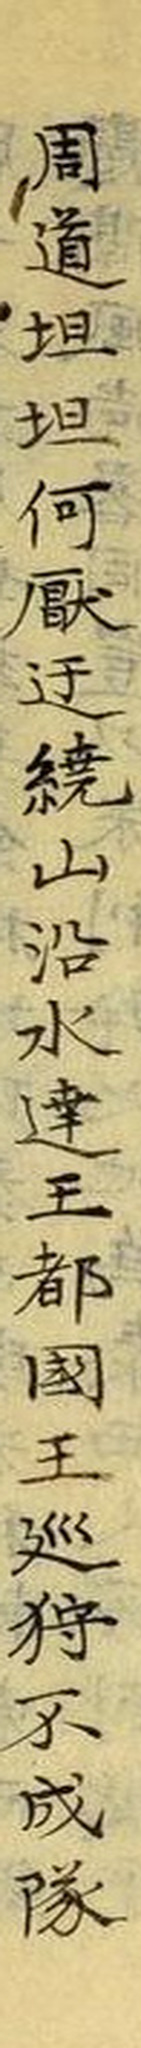周道坦坦何厭迂続山沿水達王都国王巡狩不成隊
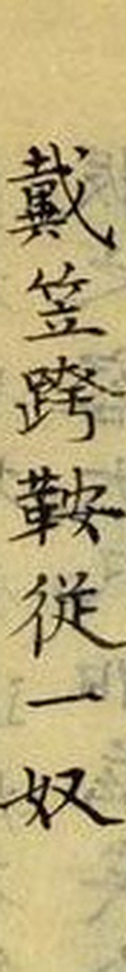戴笠跨鞍従一奴
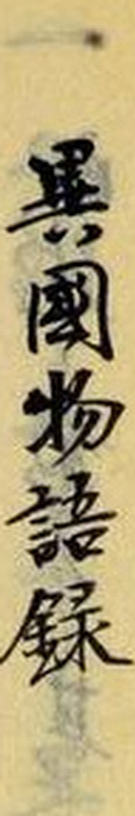異国物語録
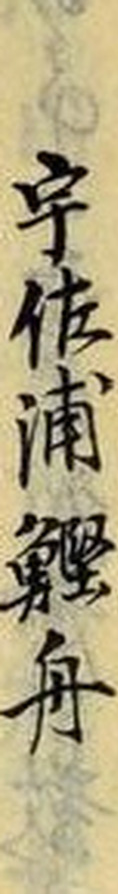宇佐浦鰹舟
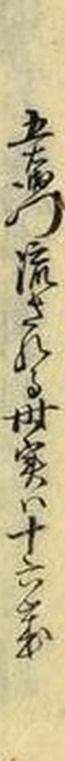五右衛門流される時実ハ十六歳
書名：漂客談奇（備考雑録写8）
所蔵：福井県文書館 Fukui Prefectural Archives
